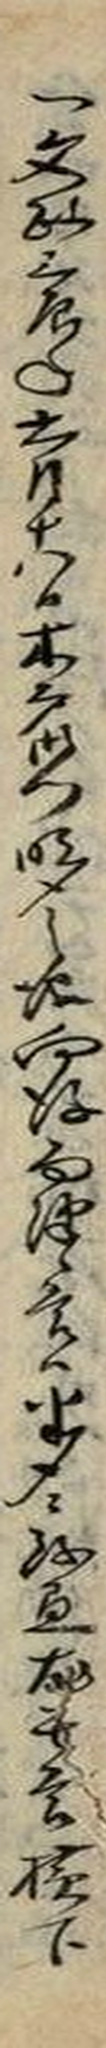一文政三辰年六月十八日木戸御門明〆之儀向後雨降之節は半〆に致置尤其節横下
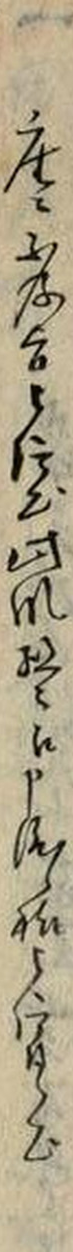座ニ不及旨被仰出此段組々江申渡候様被仰付候以上
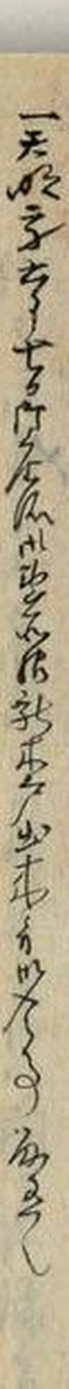一天明二寅六月七被御座所御番所脇新木戸出来ニ付御〆候事留有之
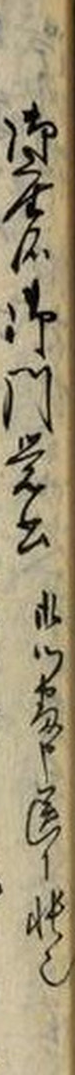御座所御門覚書御門番申送り帳也
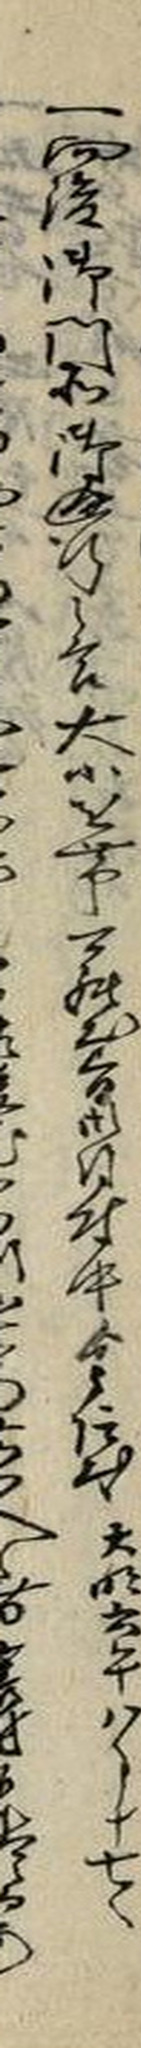一向後御門所御通行之節大小を帯可罷出旨御目付中ゟ被仰出候天明六午八月十七日
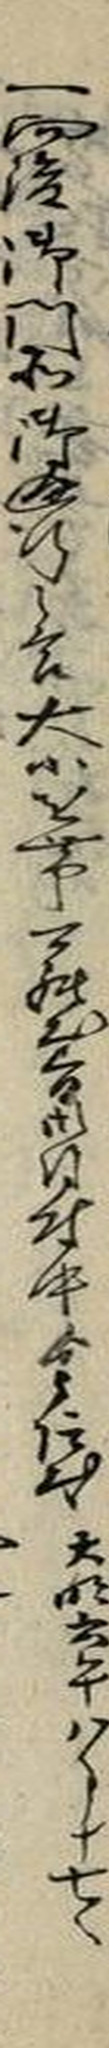一向後御門所御通行之節大小を帯可罷出旨御目付中ゟ被仰出候天明六午八月十七日
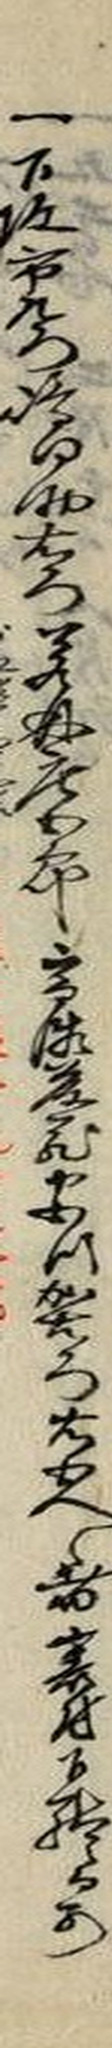一下坂市左衛門嶋田助右衛門若林庄五郎高瀬藤蔵安川加右衛門右五人之者共裏付下駄ニ而可
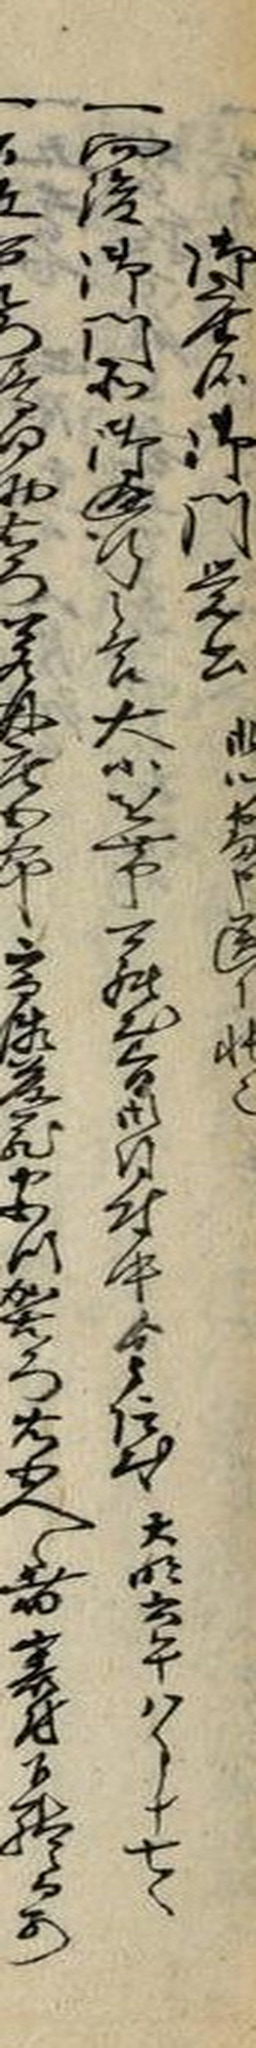一下坂市左衛門嶋田助右衛門若林庄五郎高瀬藤蔵安川加右衛門右五人之者共裏付下駄ニ而可
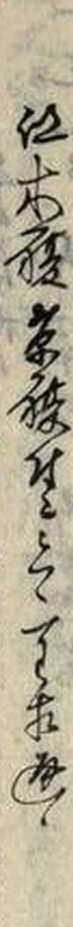但木履草履付ニ候ハヽ可被相通候
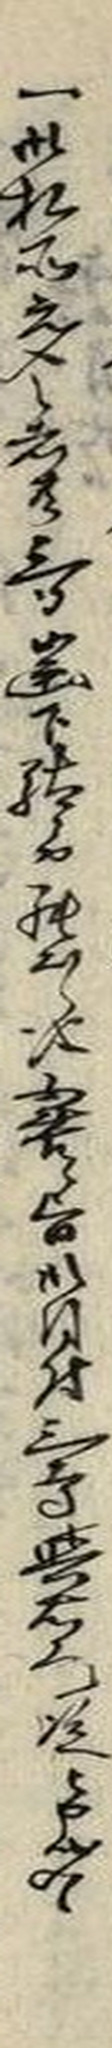一御札所元〆之者共三ツ歯下駄ニ而罷出候儀不苦候旨御目付三寺与右衛門殿被申聞候
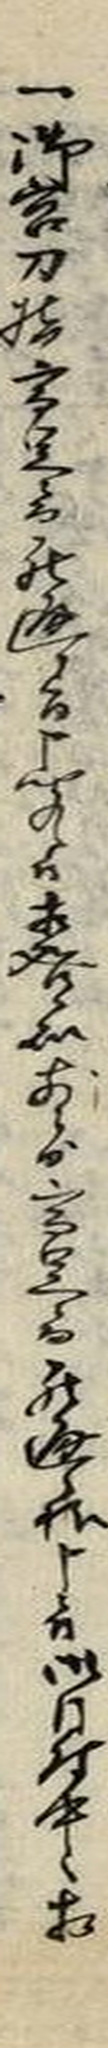一御宮刀指高足ニ而罷通候間申聞候ニ付相咎候処前々ゟ高足ニ而罷通候様申ニ付御目付中へ相
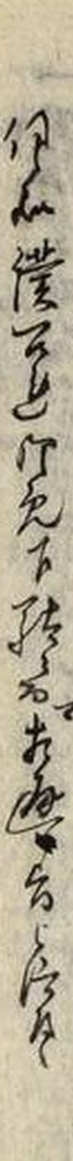伺候処僕召連御免下駄ニ而可相通旨被仰付候
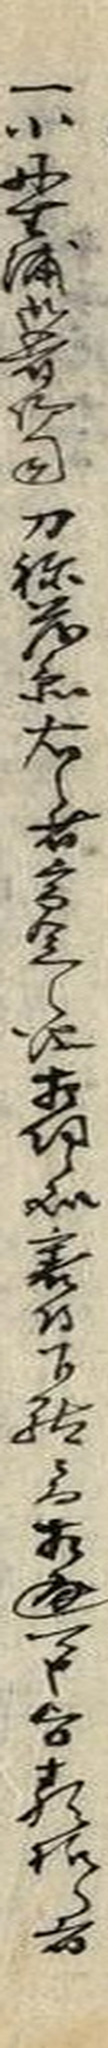一小丹生浦御肴御用刀祢茂兵衛右之者高足之儀相伺候処裏付下駄ニ而相通可申旨類様之者
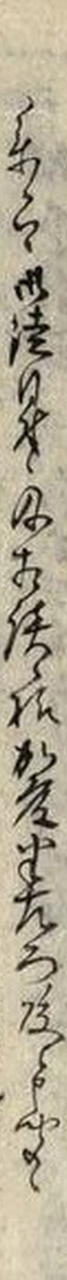参候ハヽ御徒目付へ及相談候様加藤半左衛門殿被申聞候
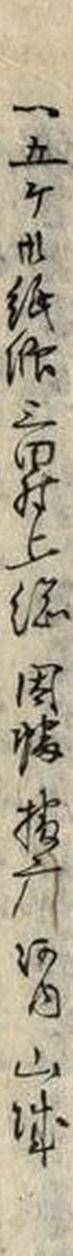一五ヶ御紙師三田村上総因幡播磨河内山城
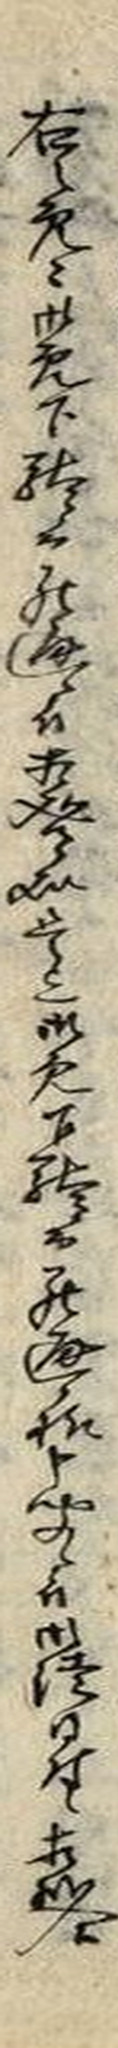右之免々御免下駄ニ而罷通候付相咎候処是迄御免下駄二而罷通候様申聞候ニ付御徒目付へ相掛合候
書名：御門御櫓之部
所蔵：福井県文書館 Fukui Prefectural Archives
